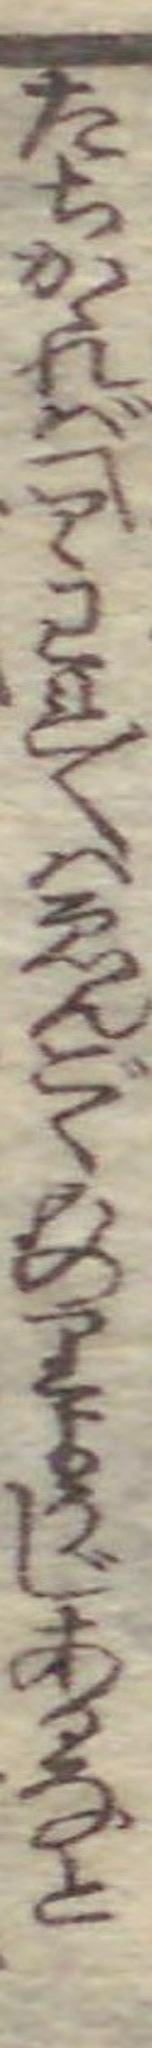たちかゝれば〽アヽわれ〳〵はゑんごくものりようじあるなと
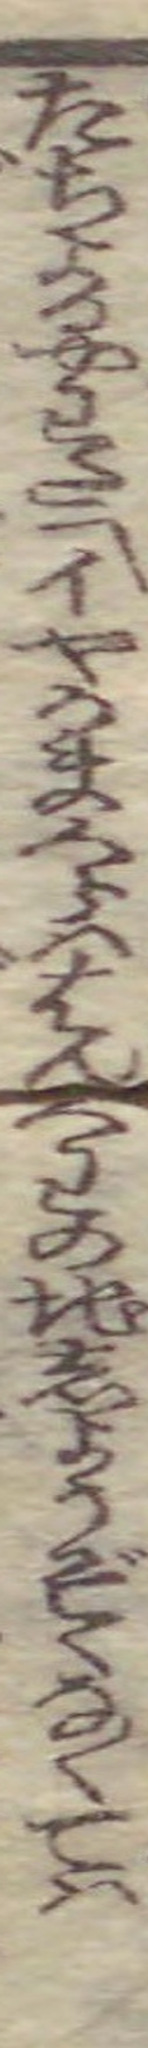たちよるやわた〽イヤかまくらははんへわの地しようぞくなくては
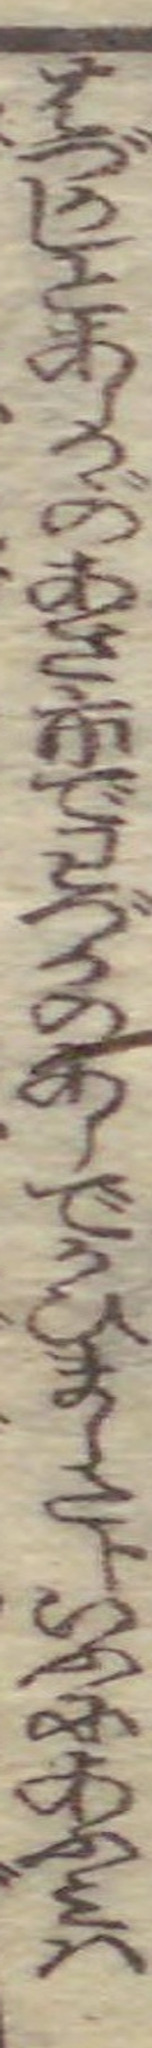はづかしとあしかゞのあさ市でわづかのあしでかましたといふにあふみは
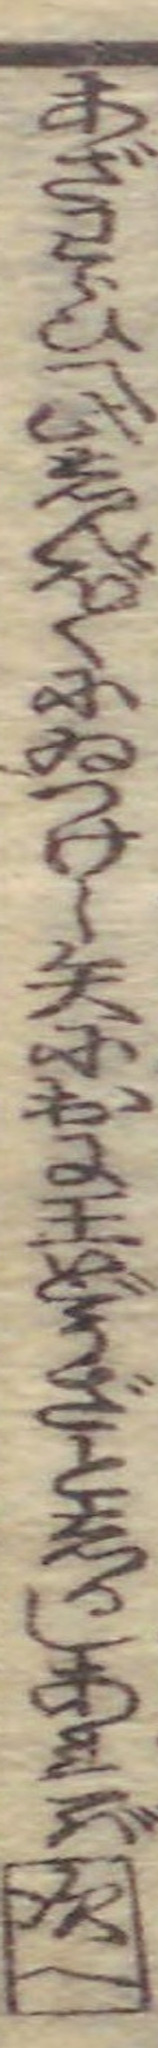あざわらひ〽此しんぼくにゐつけし矢におに王どうざとしるしあれば次へ

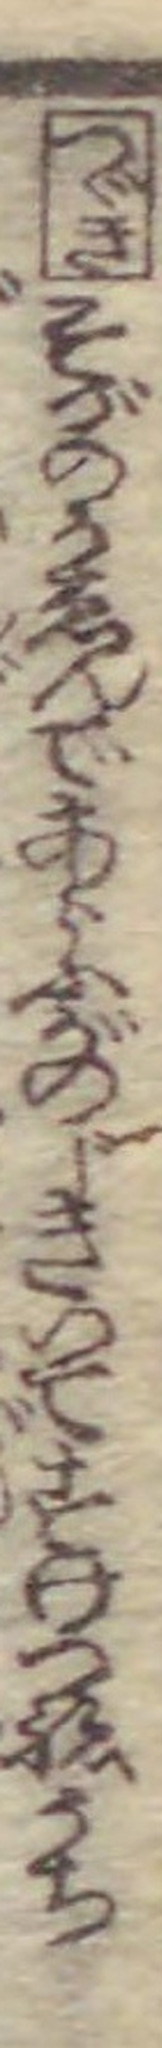つづきそがのうゑんであらうがのじきいてすけつねうち
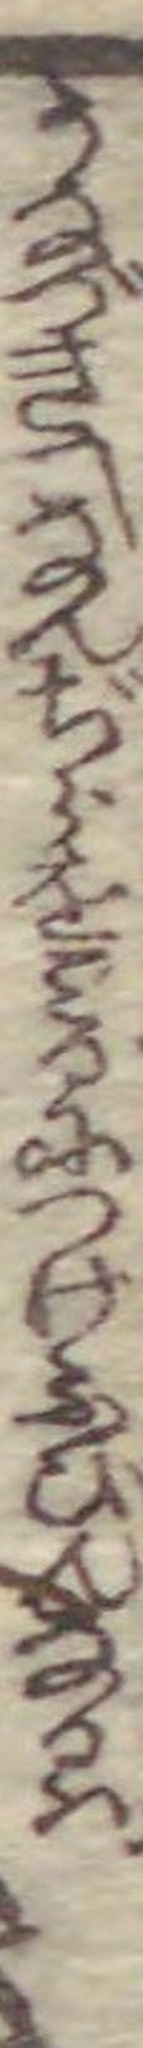うなづき〽なんぢらをみるにつけふびんなるは
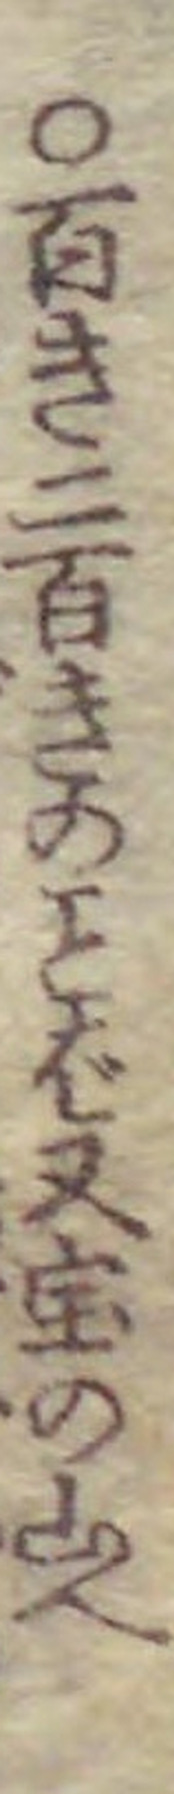○百き二百きのことば又宝の山へ
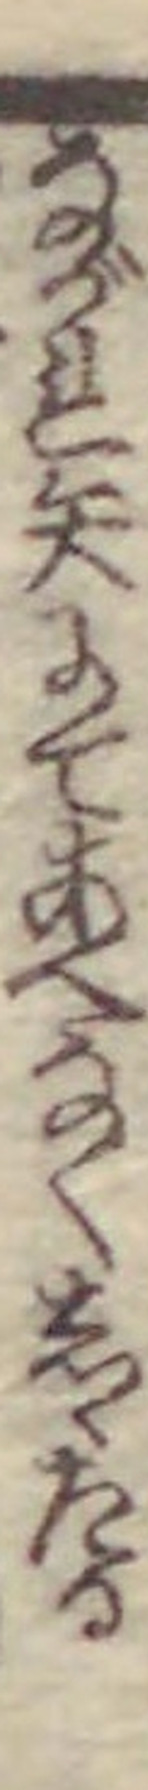ながれ矢にてあへなくしゝたる
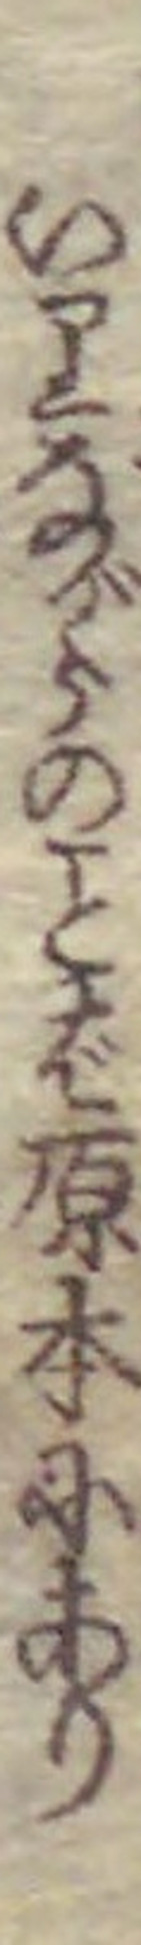いりながらのことば原本にあり
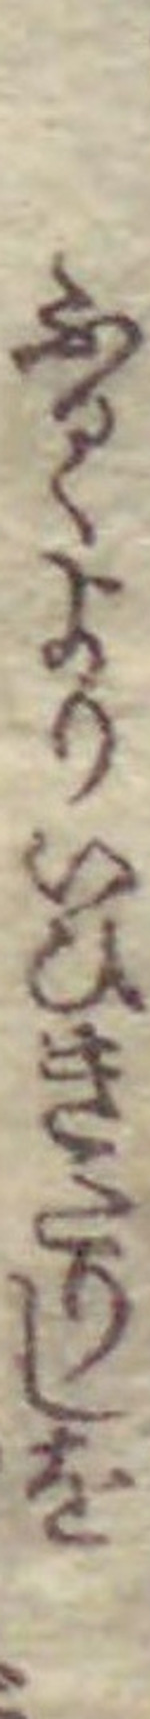ふるくよりいひきたりしを
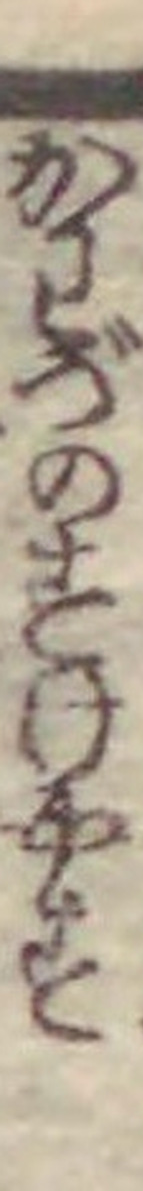かわづのすけやす
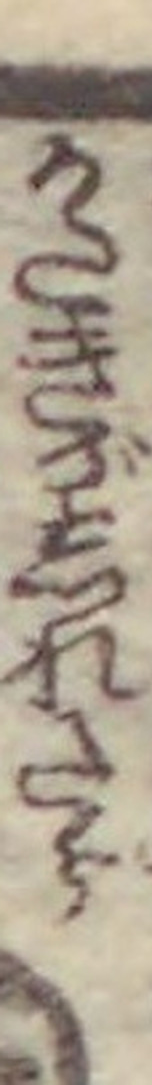かたきがしれたら
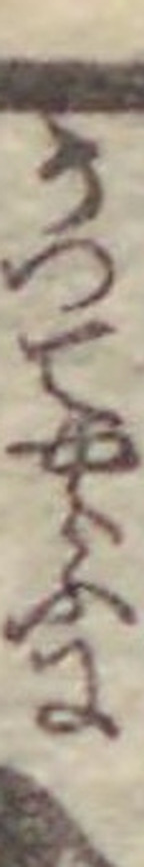うつてやらふに
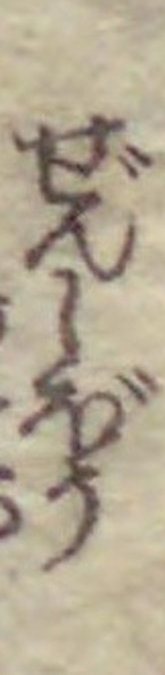ぜんしぼう
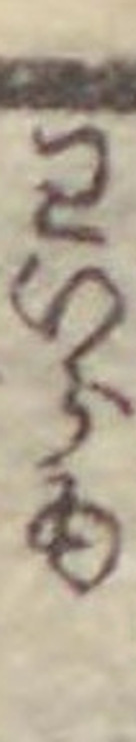わいらも
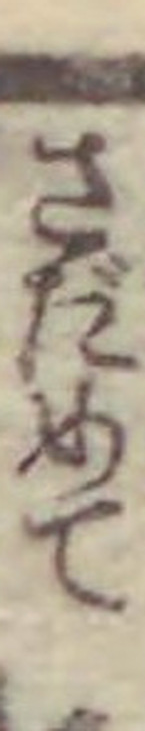さだめて
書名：大時代唐土化物 3巻. 曽我太夫染
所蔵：国立国会図書館 National Diet Library, JAPAN
